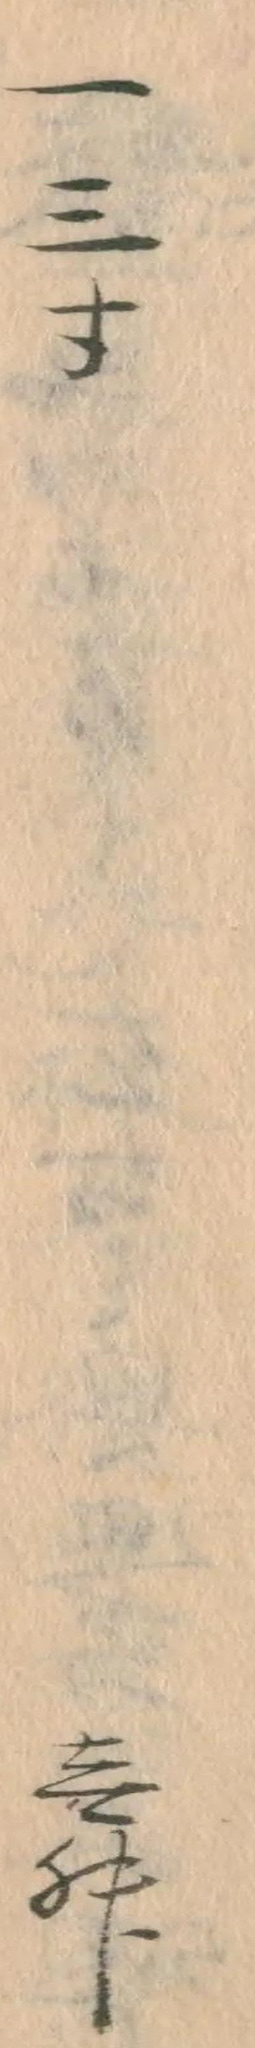一三寸壱升
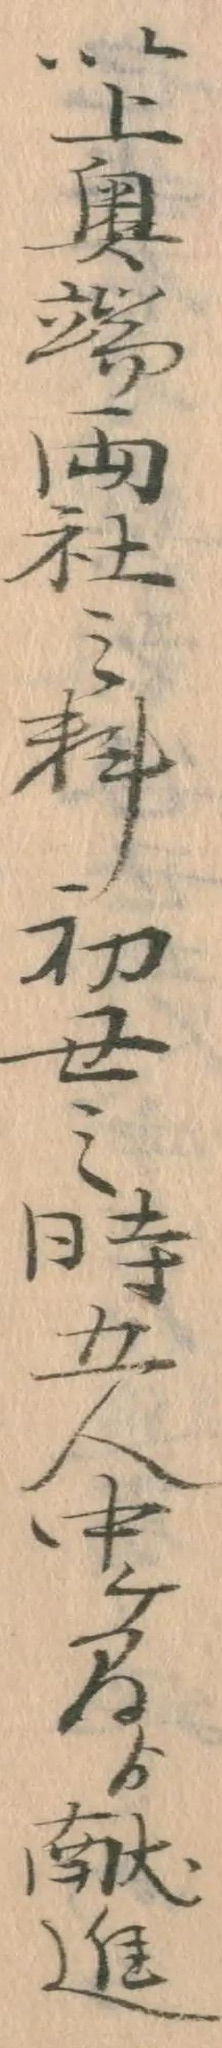以上奥端両社之料初丑之時五人中ケ間ゟ献進
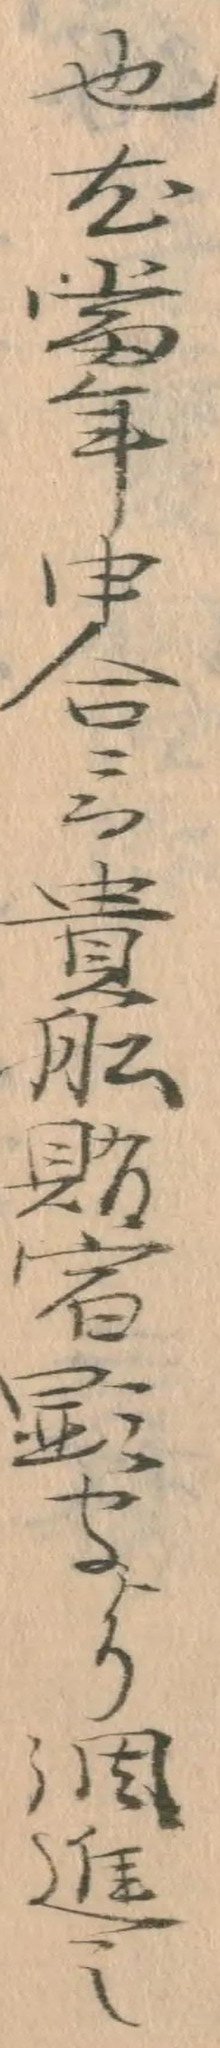也尤當年申合ニ而貴舩賄宿顕守より調進之
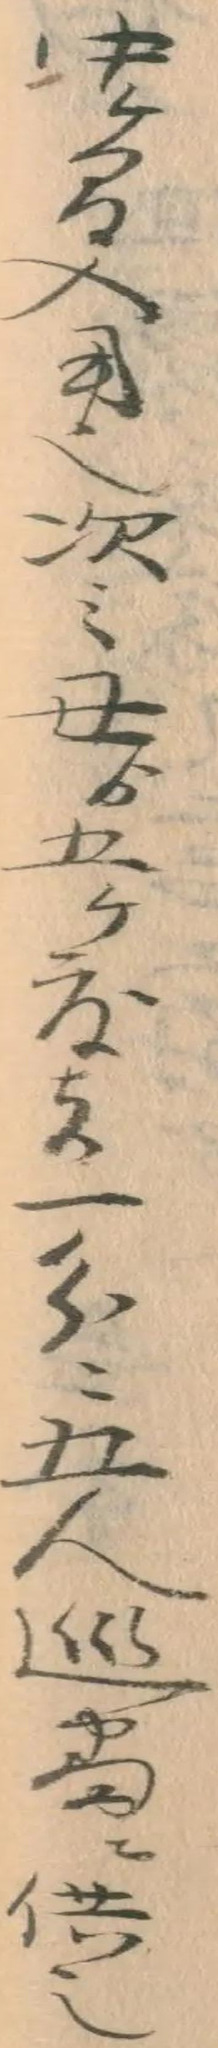壱ケ間入用也次之丑ゟ五ケ度者一分ニ五人巡番ニ供之
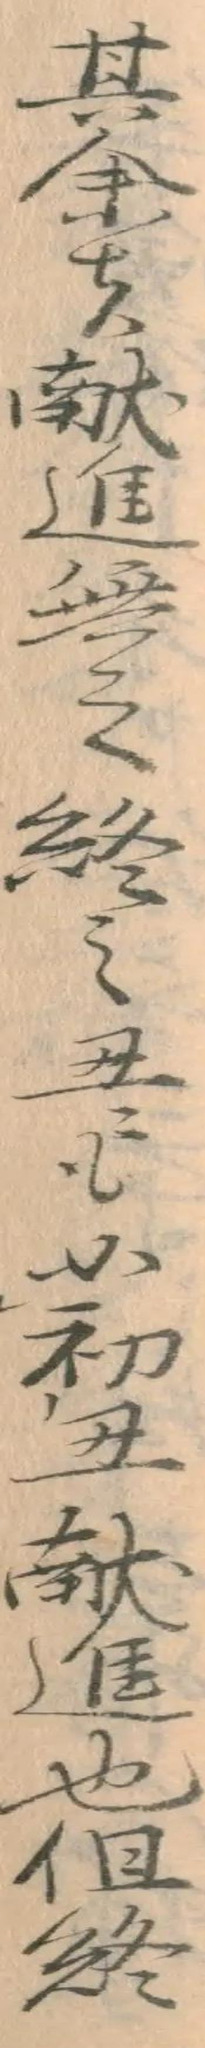其余者献進無之終之丑ニも如初丑献進也但終
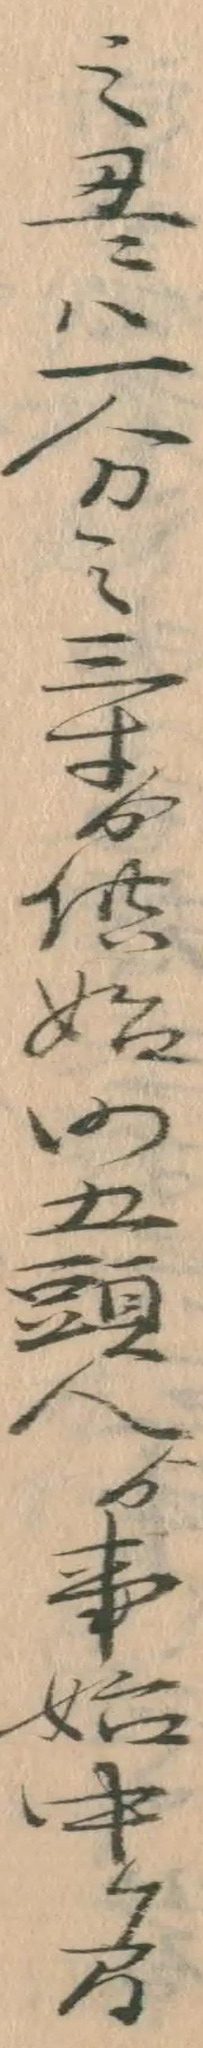之丑ニは一分の三寸ゟ供始仍五頭人ゟ事始中ヶ間
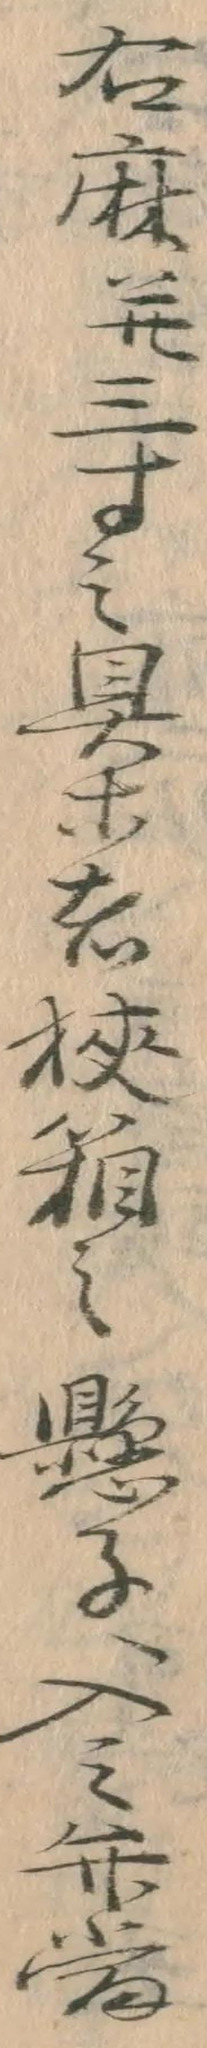右麻并三寸之具等者挟箱之懸子へ入之弁當
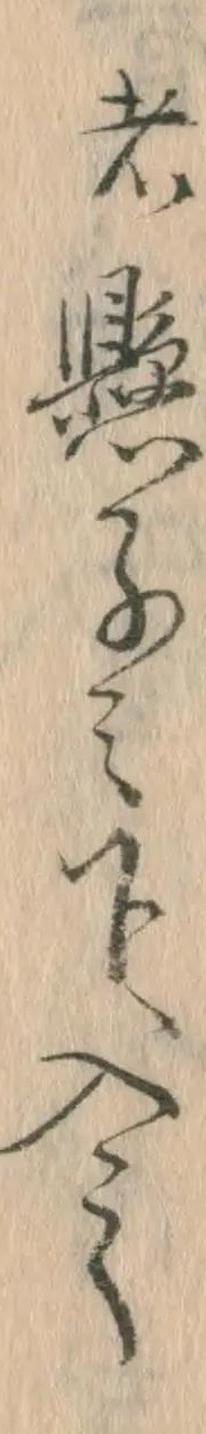者懸子之下へ入之
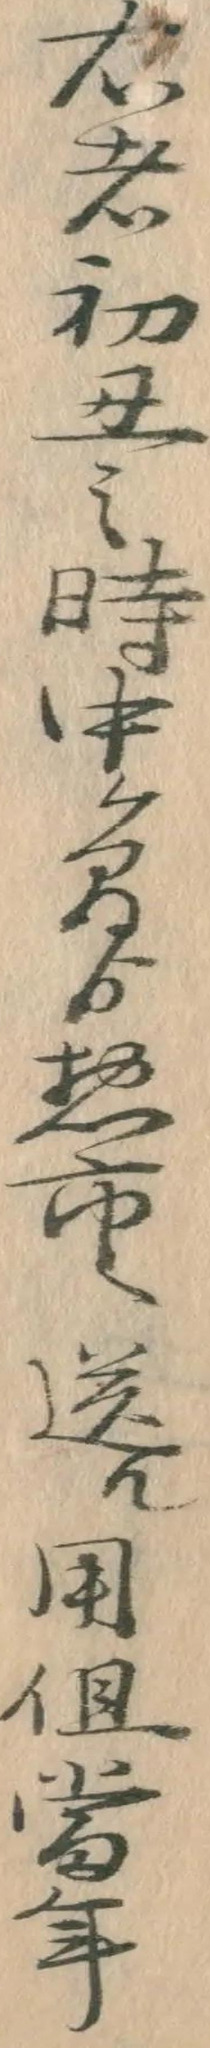右者初丑之時中ヶ間ゟ惣市へ送ル用但當年
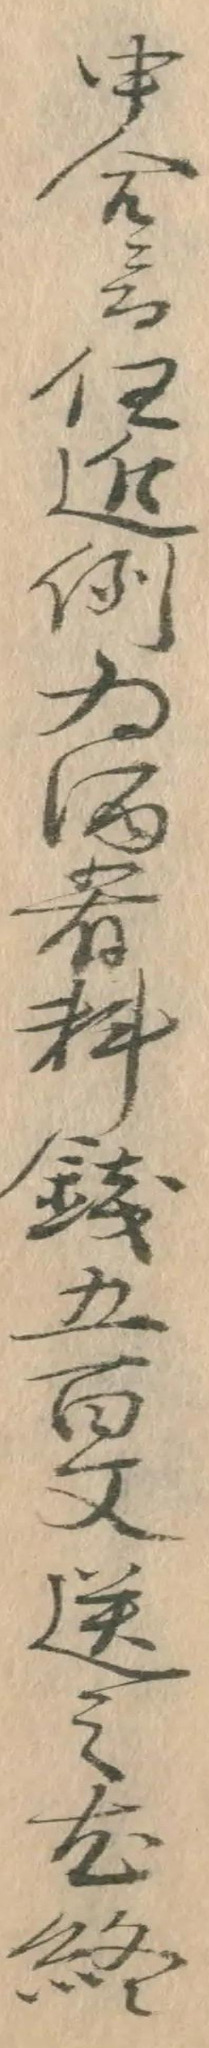申合ニ而任近例為酒肴料銭五百文送之尤終
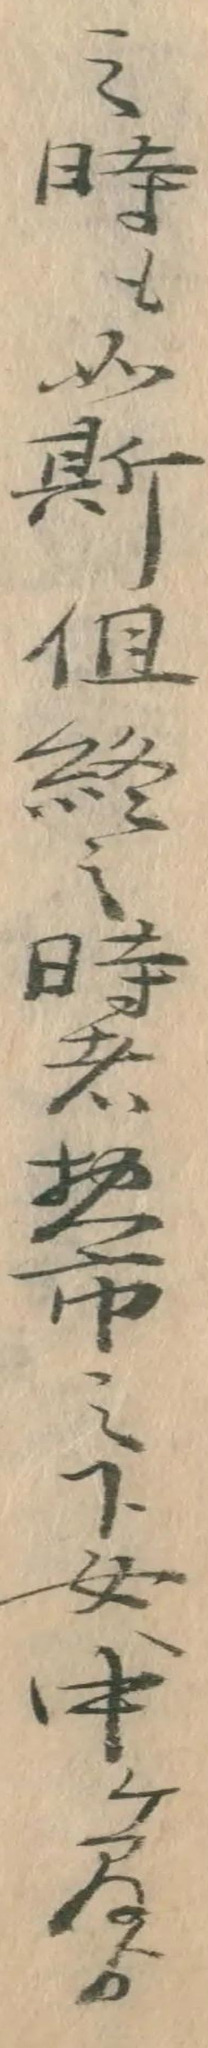之時も如斯但終之時者惣市之下女ヘ中ケ間ゟ

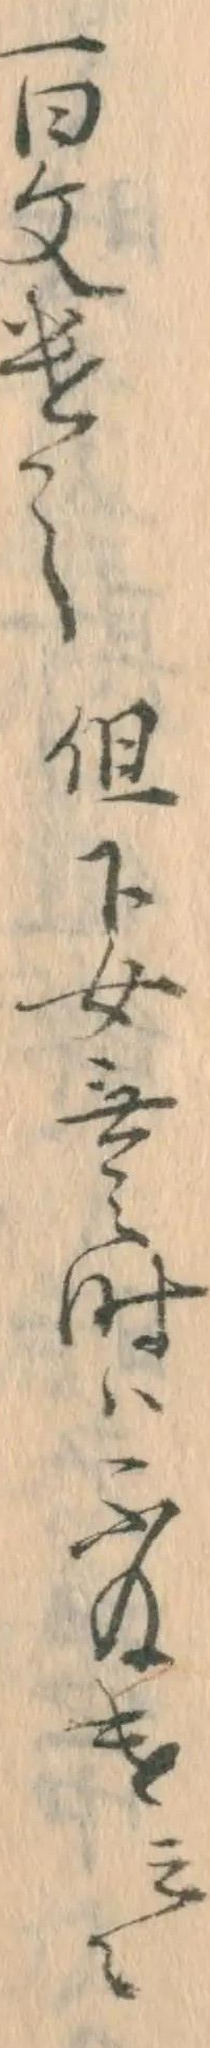百文遣之但下女無之時ハ不及遣云々
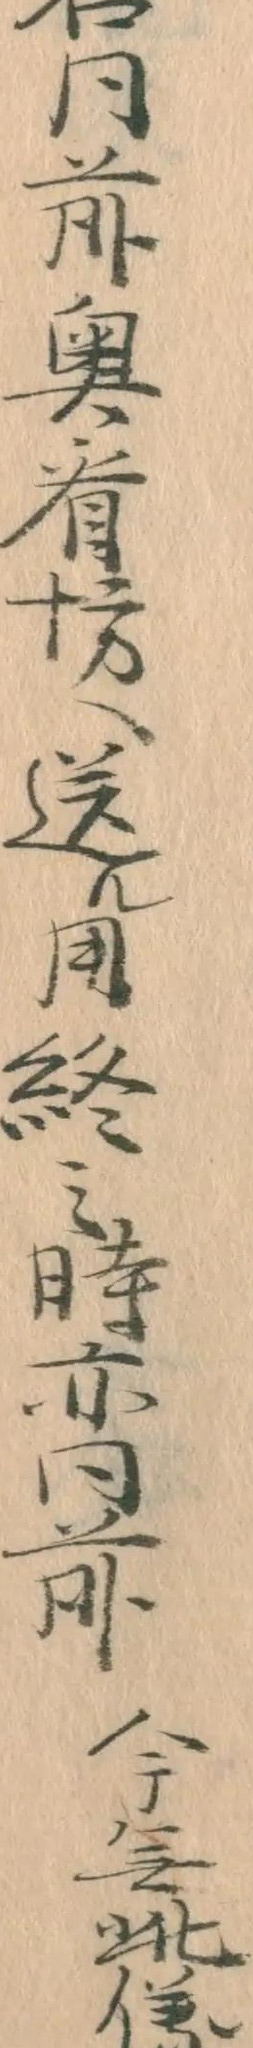右同前奥看坊へ送ル用終之時亦同前今無此儀
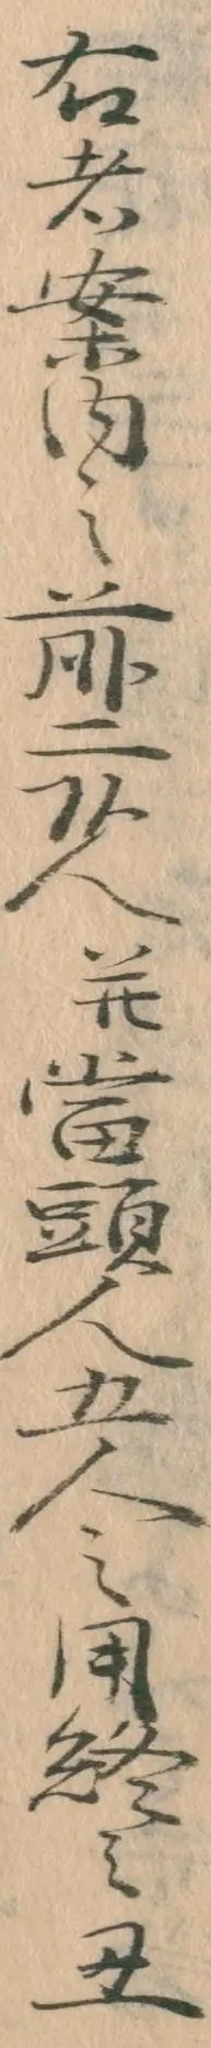右者案内之前二頭人并當頭人五人之用終之丑
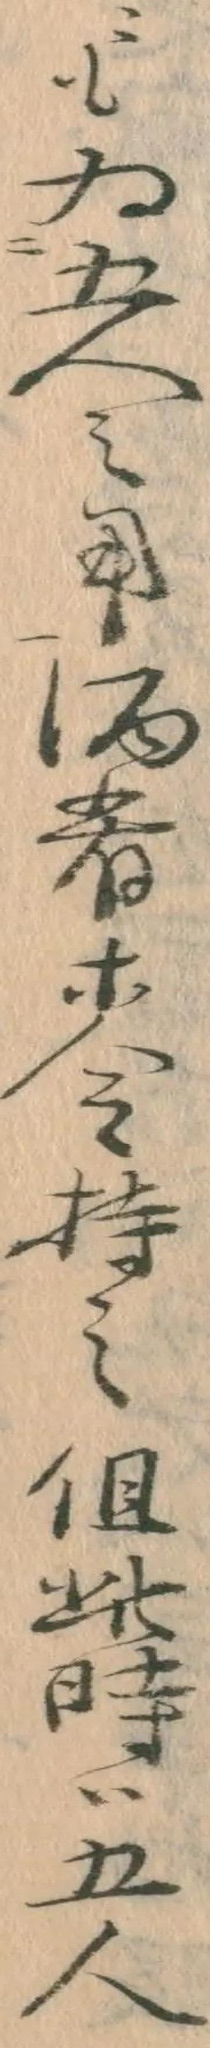ニも為五人之用酒肴等令持之但此時ハ五人
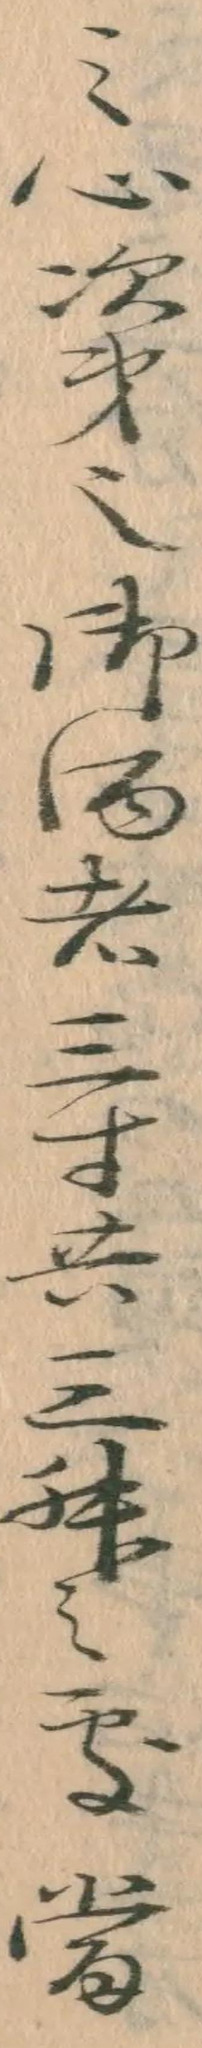之心次第也御酒者三寸共三升之處當
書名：賀茂社記録. 第72冊
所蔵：国立国会図書館 National Diet Library, JAPAN
